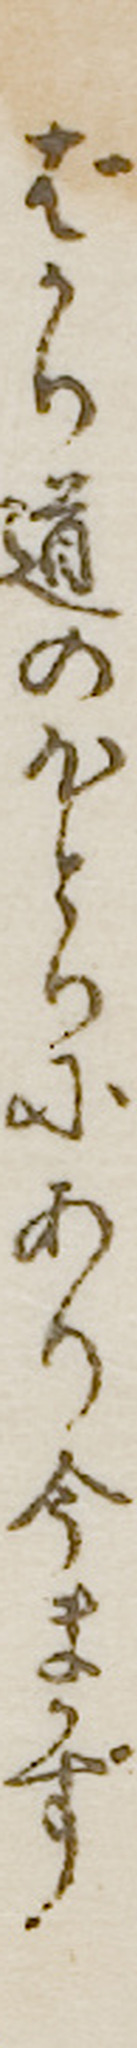ばかり道のほとりにあり今まかず
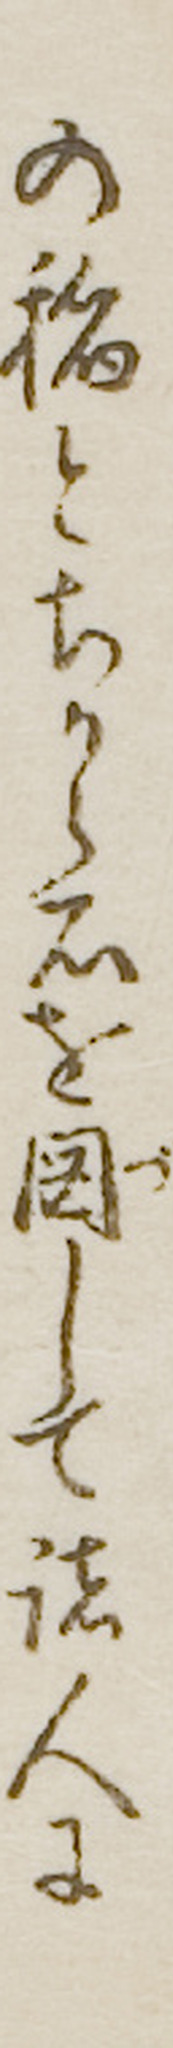の稲とちから石を図して諸人に
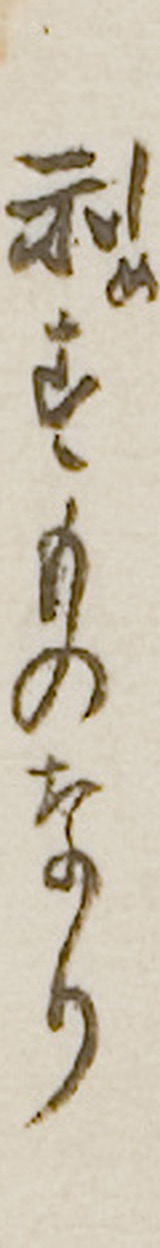示すものなり
